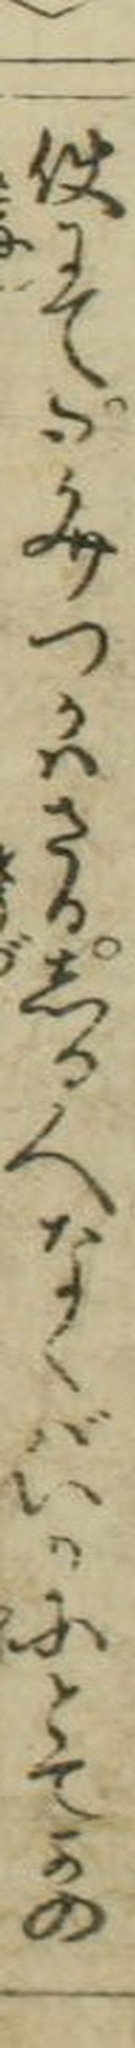使にて。御文つかはさる。しるへなくばいかにとてかの
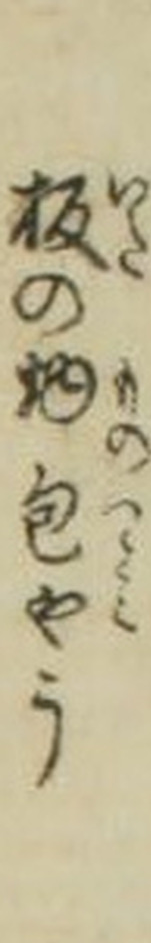板の物包やう墨筆
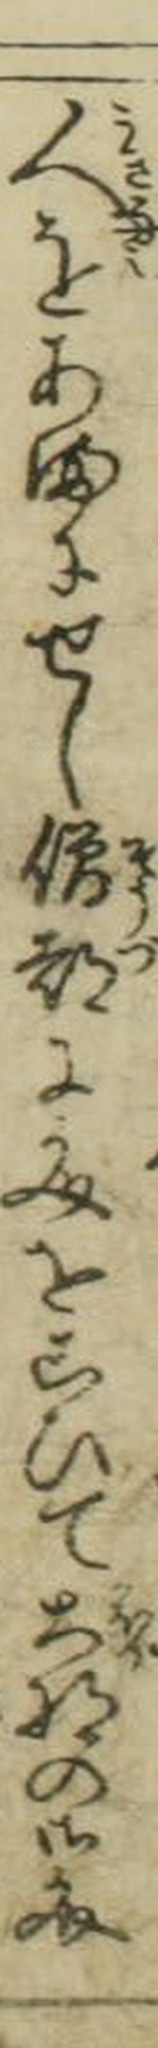人をあまにせし僧都に文をこひて大将の御文
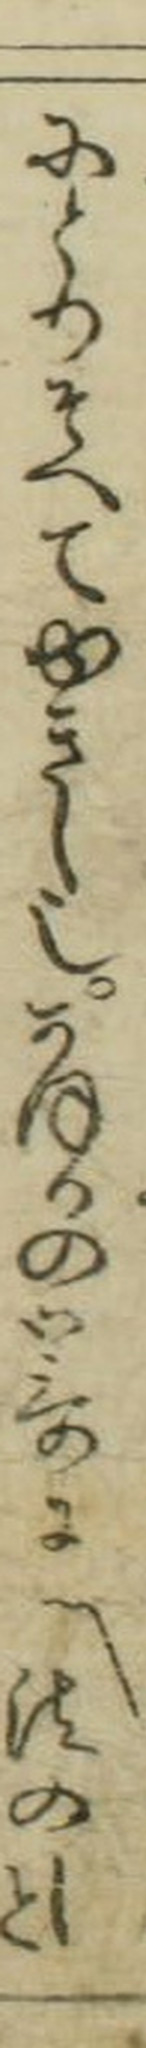にとりそへてゆきし也。かほるの御哥に〽法のしと
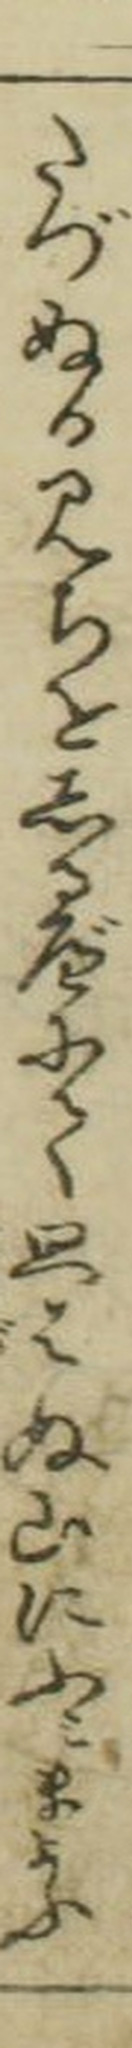たづぬるみちをしるべにて思はぬ山にふみまよふ
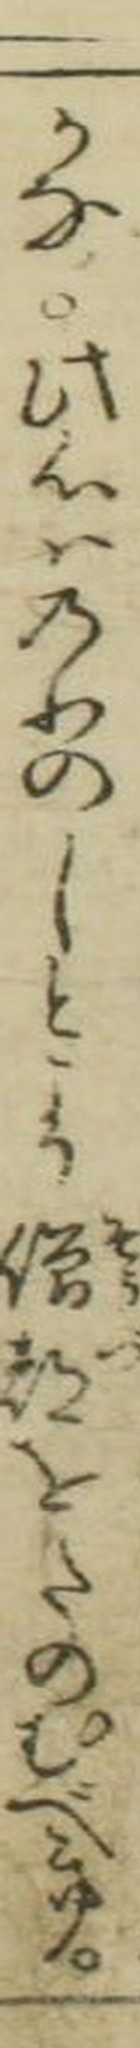かな◯此心はのりのしとより僧都をたのむべき。
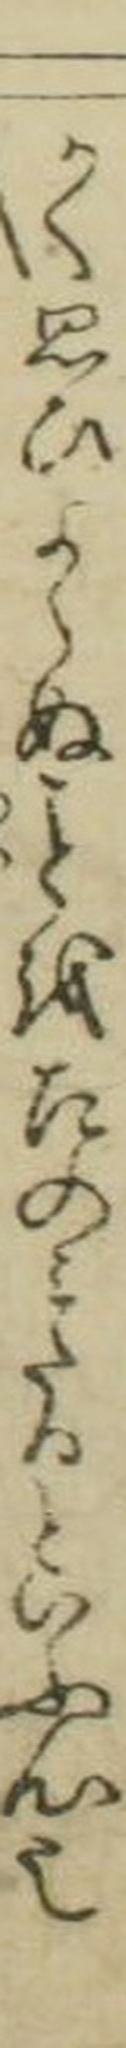かく思ひよらぬことをたのみたるといふ心也
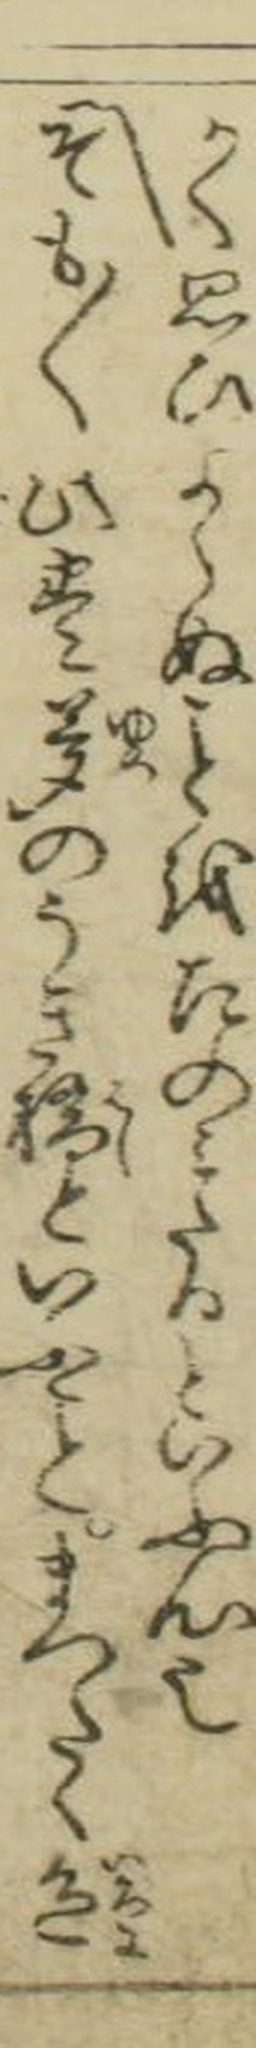〽そも〳〵此巻夢のうき橋といふこと。まつたく色
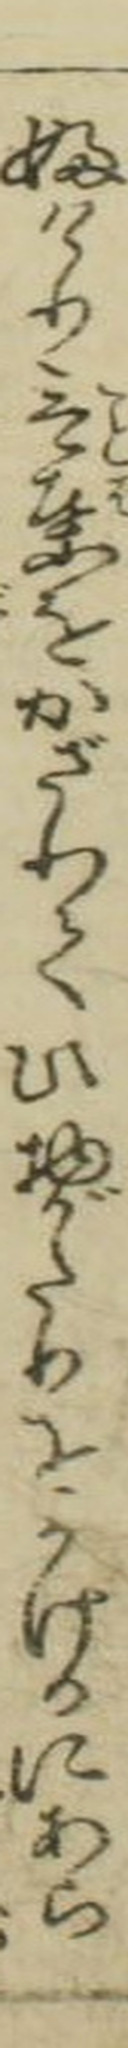ふけり言葉をかざりて此物がたりをかけるにあら
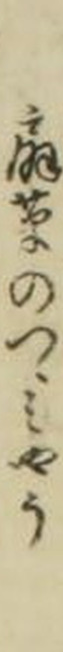扇草のつゝみやう
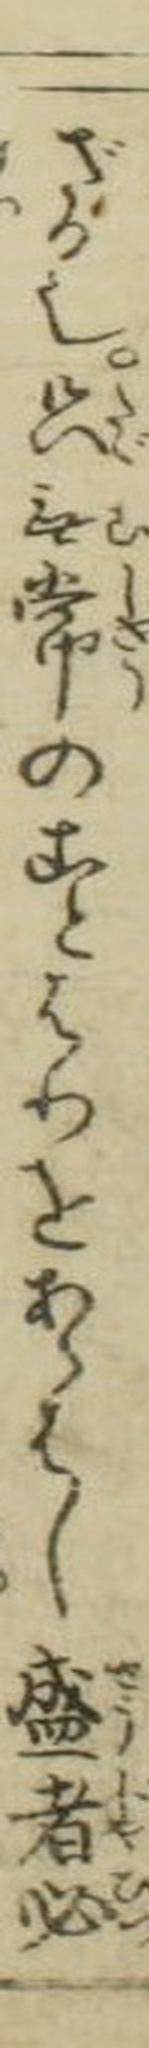ざる也。只無常のことはりをあらはし盛者必
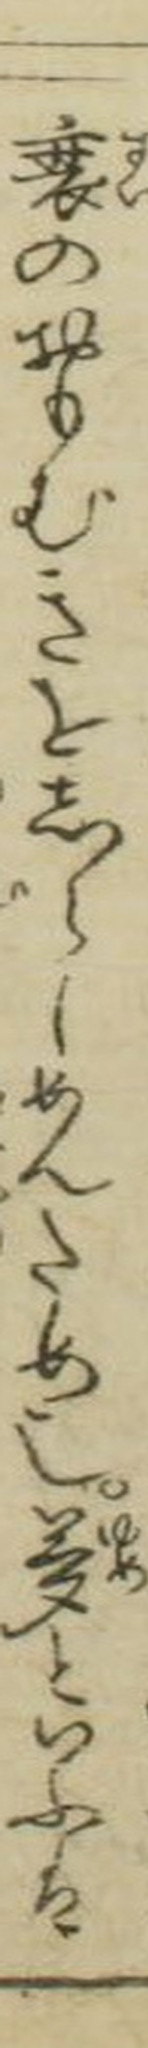衰のおもむきをしらしめんため也。夢といふは
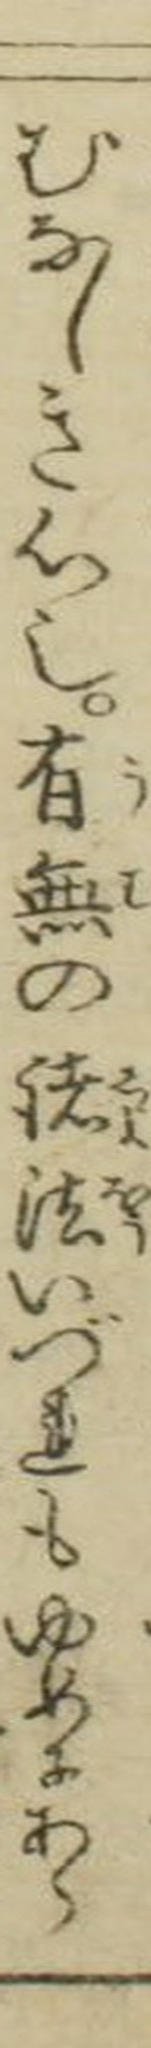むなしき心也。有無の諸法いづれもゆめにあら
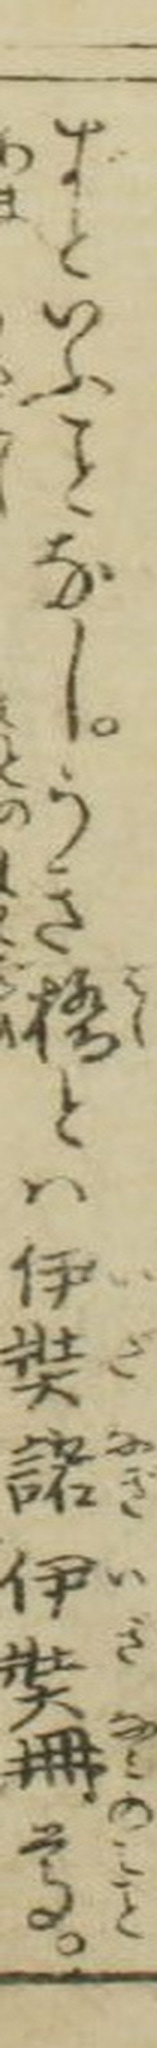ずといふことなし。うき橋とは伊弉諾伊弉冉尊。
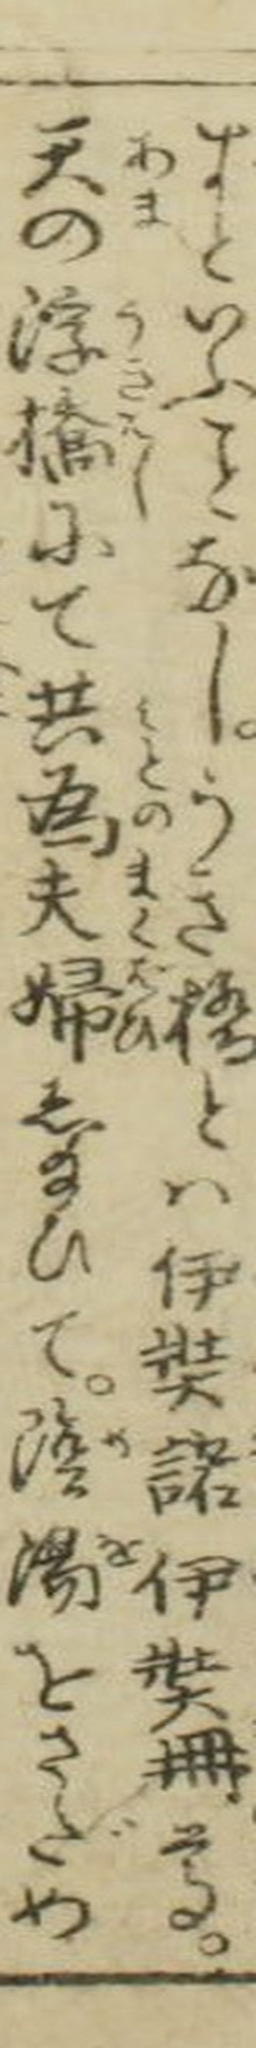天の浮橋にて共為夫婦し給ひて。陰陽をさだめ
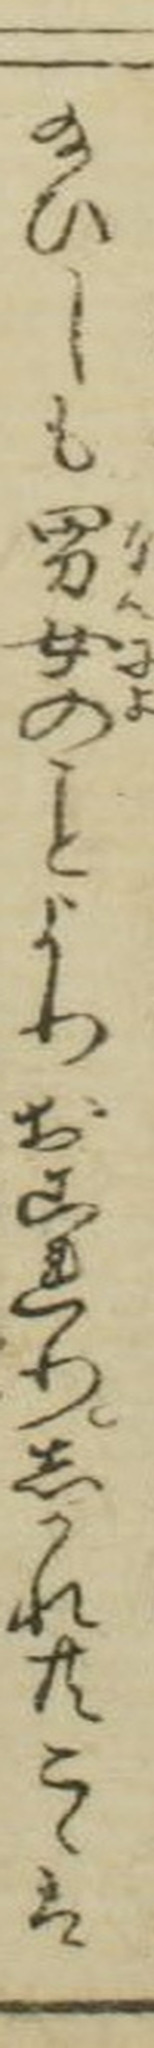給ひしも男女のことよりおこれり。しかれ共こゝは
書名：女源氏教訓鑑
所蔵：東京学芸大学附属図書館
